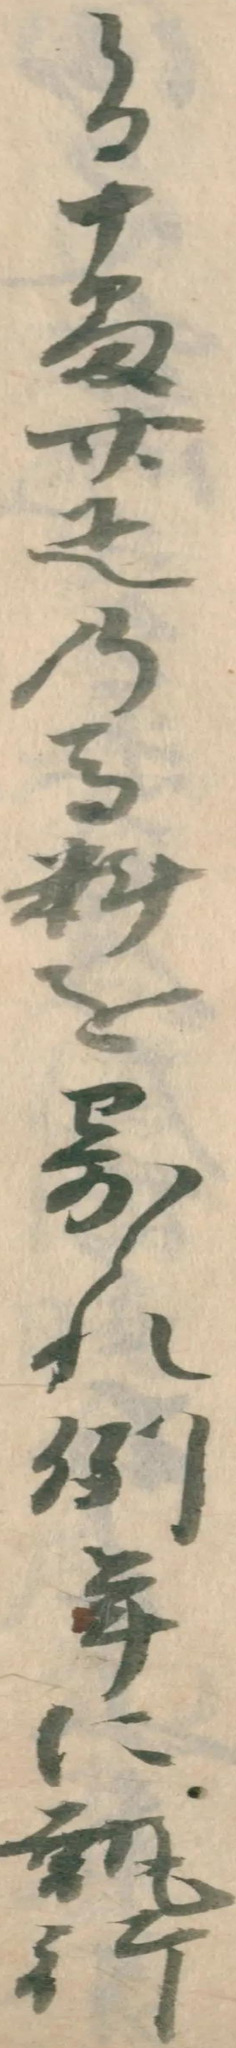らる十番廿疋の馬料を寄られ例年に執行
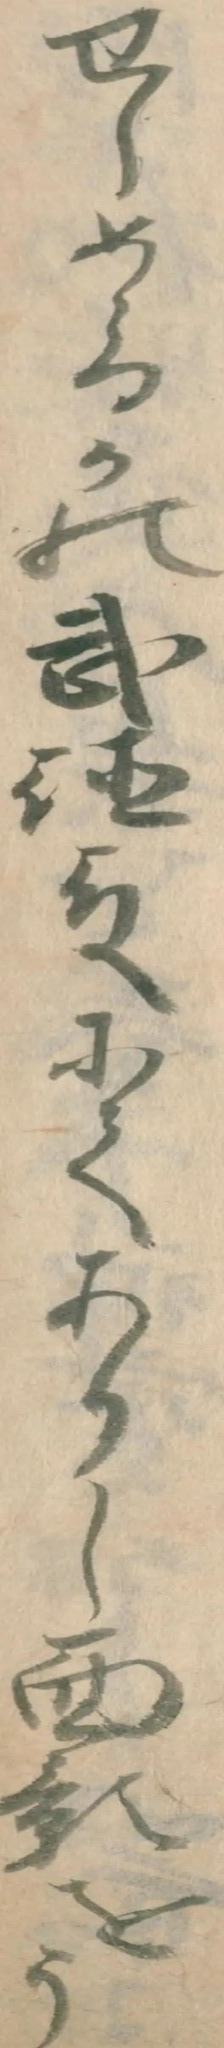せしめらるかの武徳殿にてありし面影をう

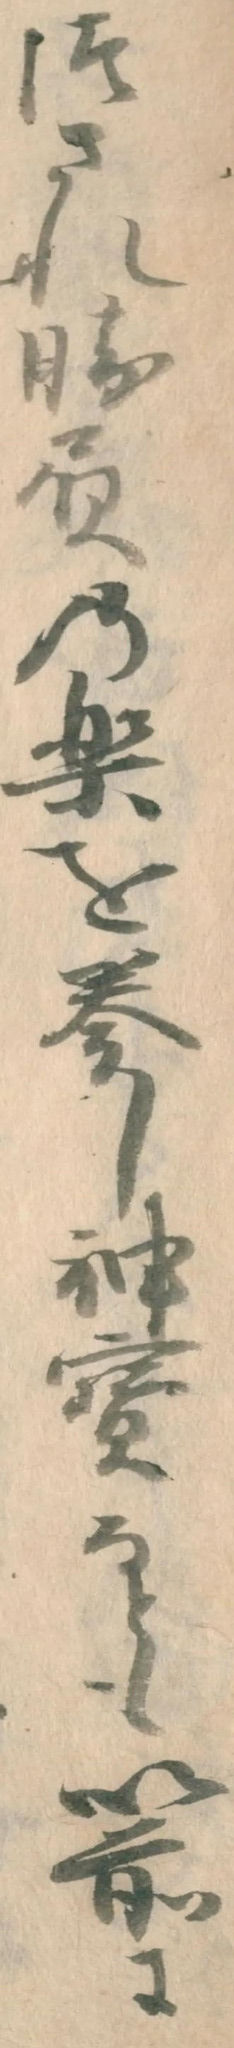つされ勝負の楽を奏し神宝なとも以前に
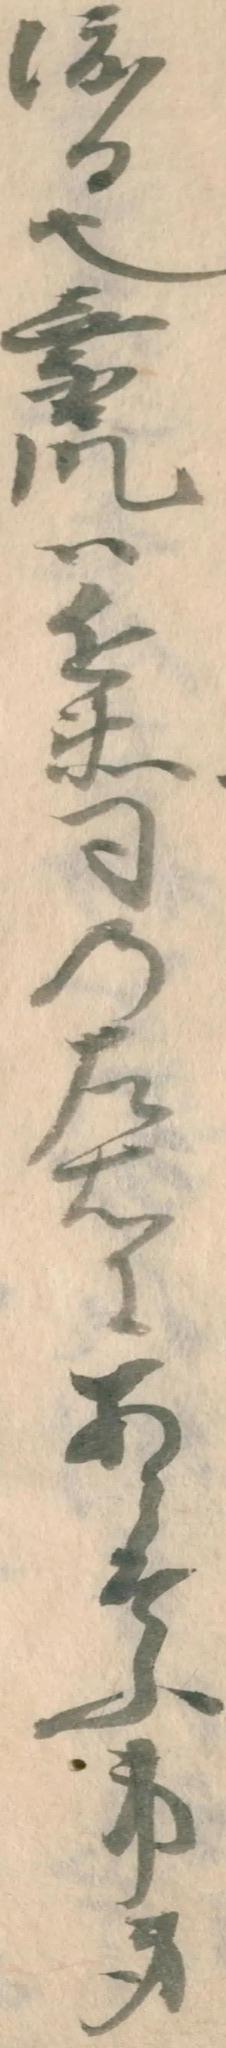渡る也乗尻は近衛司の左右にあらそふ事身
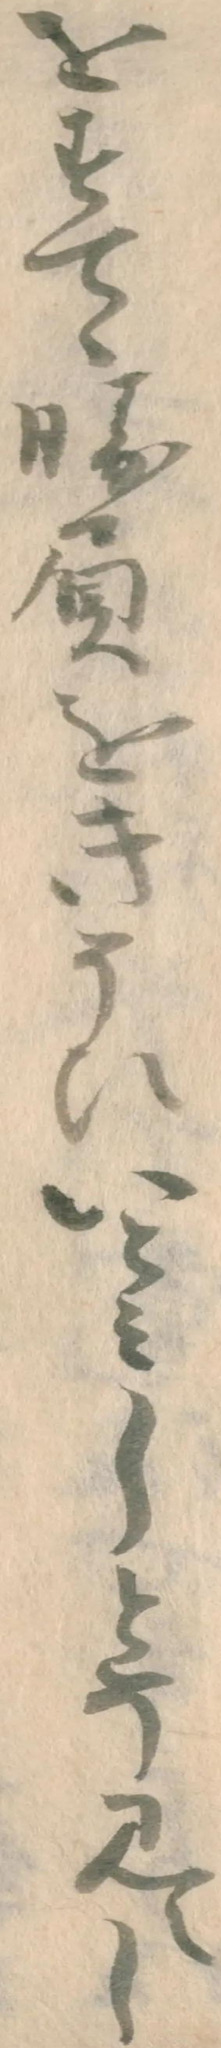をすてゝ勝負をきそひいとみしとそ見えし
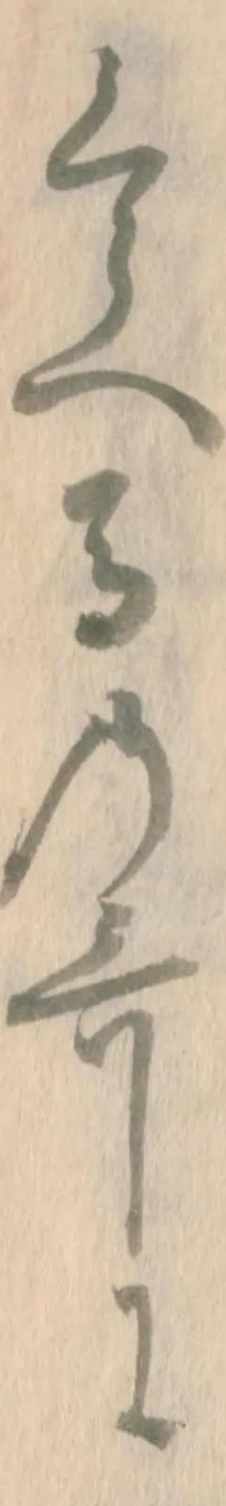くらへ馬の哥に
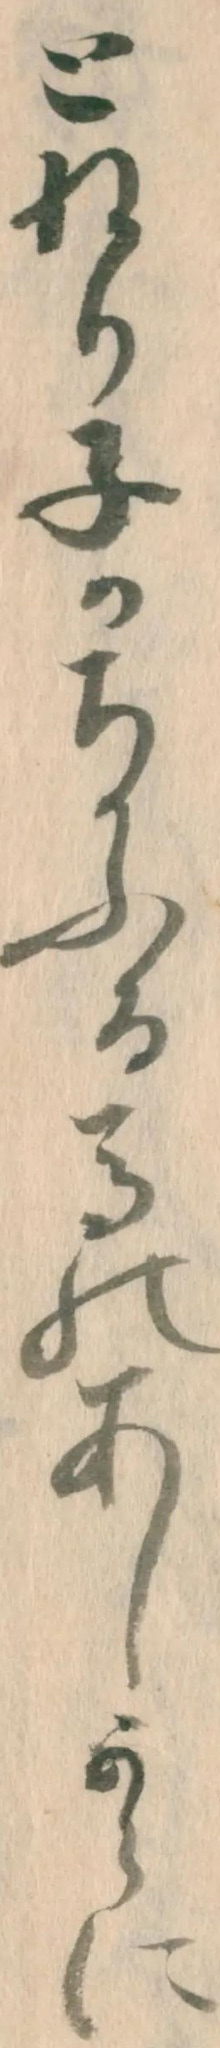とねり子かちかふる馬のあしからに
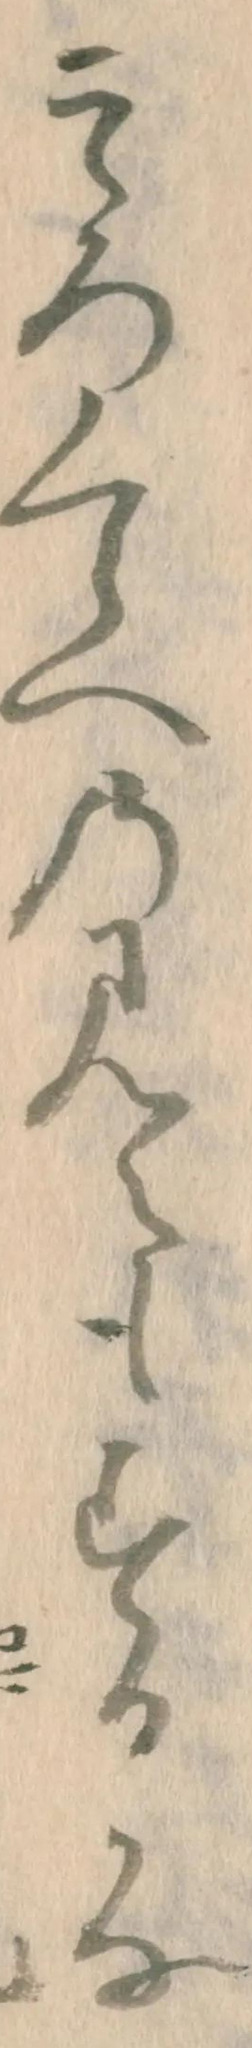こゝろくらへの見えもするかな
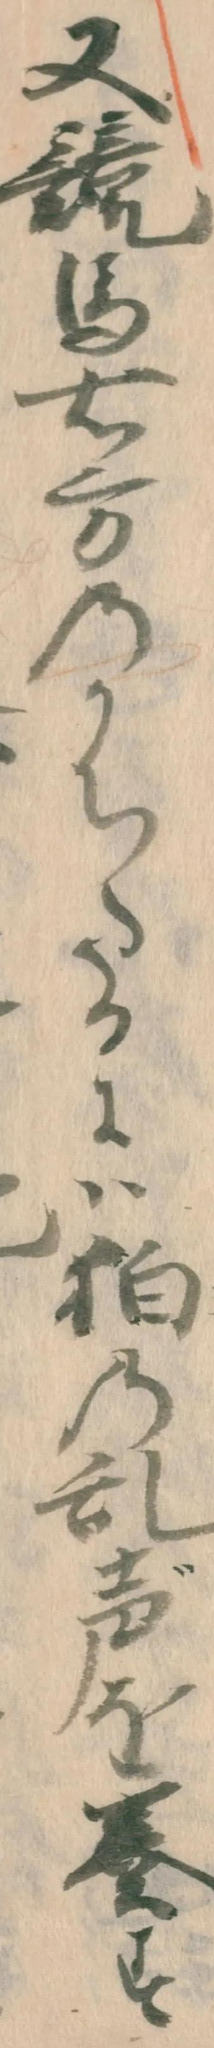又競馬右方のかちたるには狛の乱声を奏す
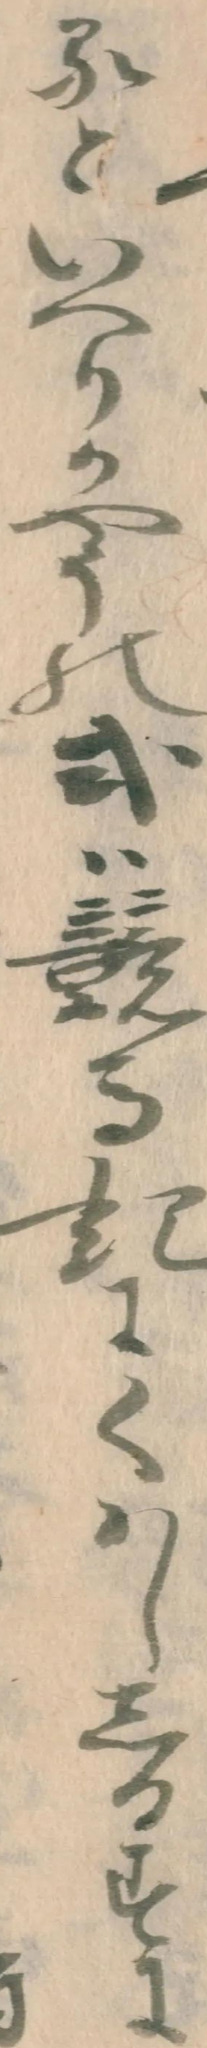るといへりかやうの式は競馬記にくはししるすに
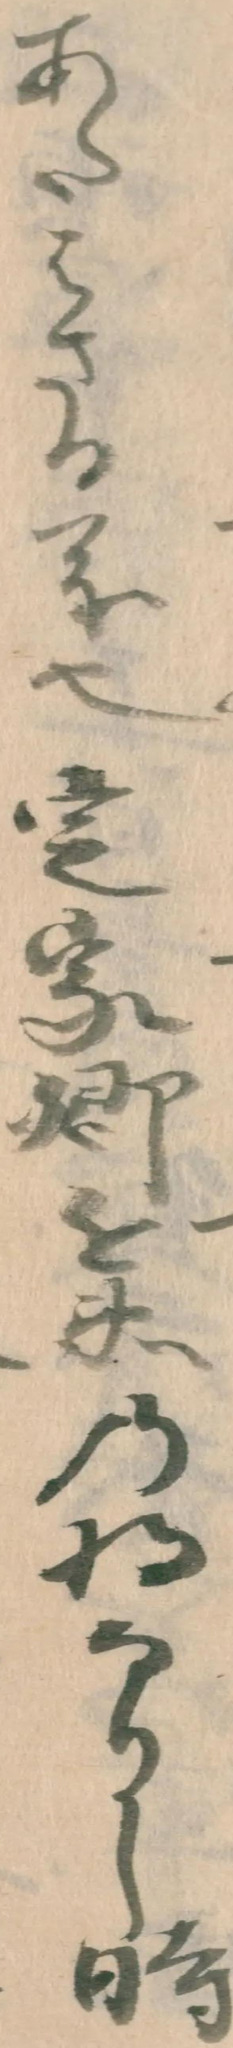あたはさる義也定家卿近衛の将なりし時
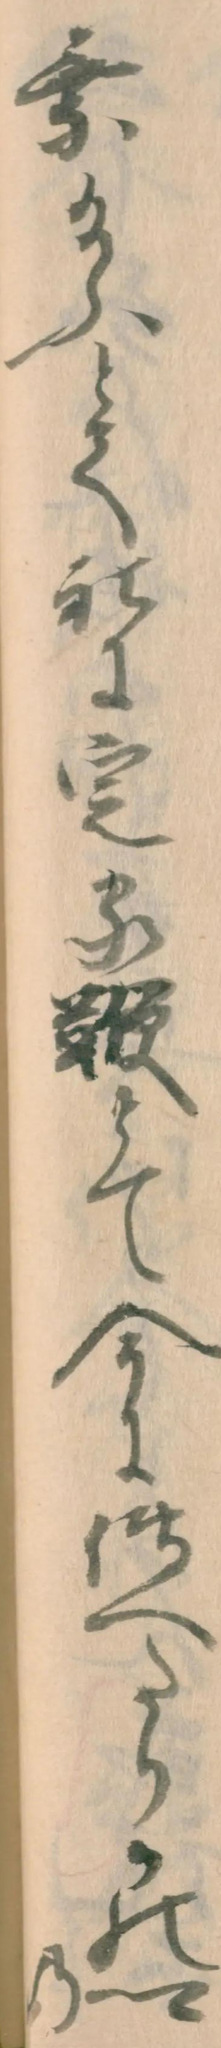乗給ふとて社に定家鞭とて今に伝へたりかの卿の
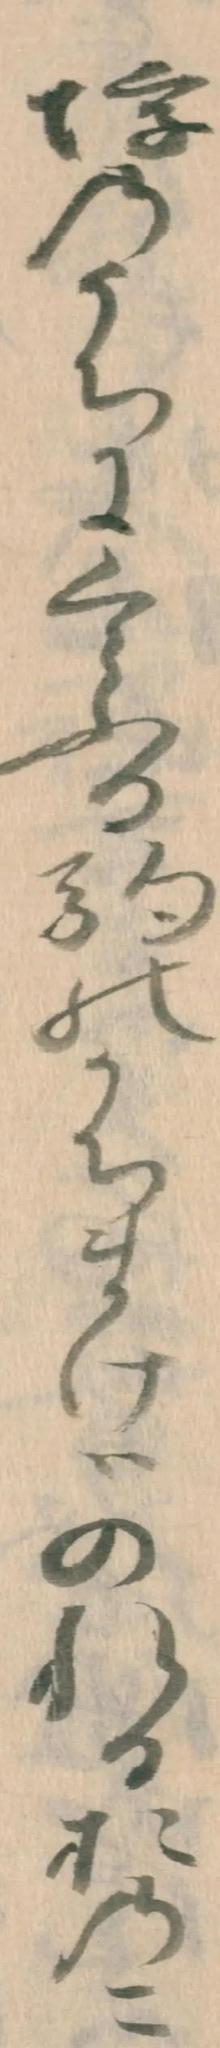埒のうちにくらふる駒のかちまけはのれるおのこ
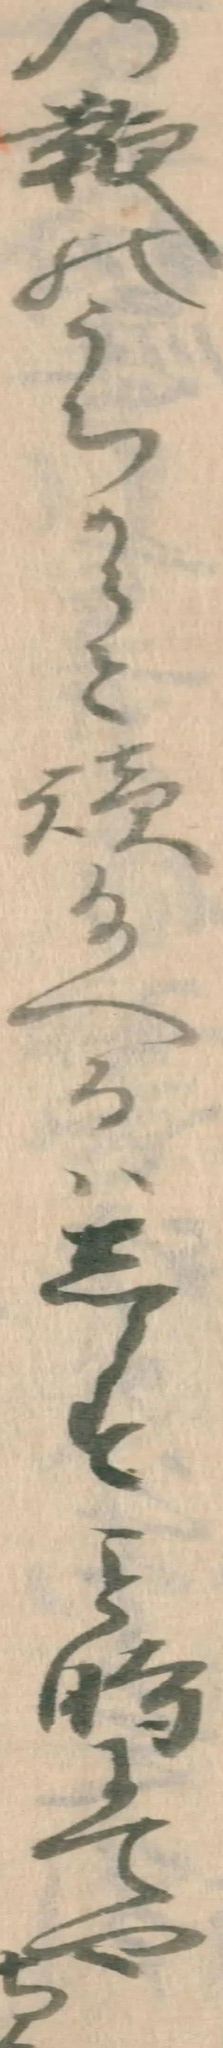の鞭のうちからと読給へるはしらすこと時にてや侍る
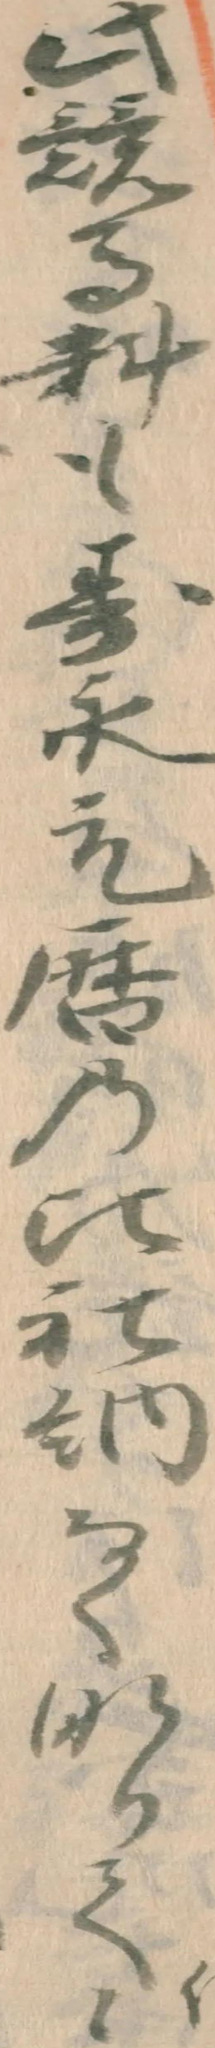此競馬料も寿永元暦の比社納なくなりて候
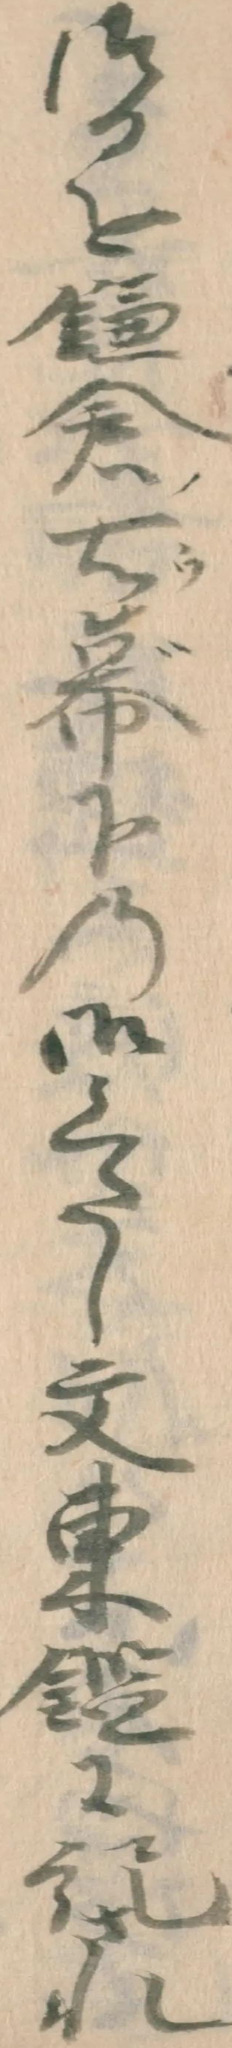つるを鎌倉右幕下の御くたし文東鑑に記され
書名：賀茂社記録. 第1冊
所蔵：国立国会図書館 National Diet Library, JAPAN
